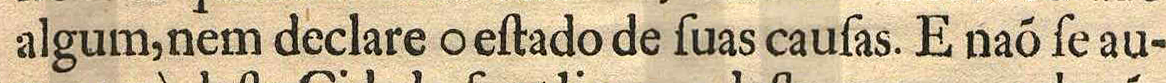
algum, nem declare o estado de suas causas. E naõ se au
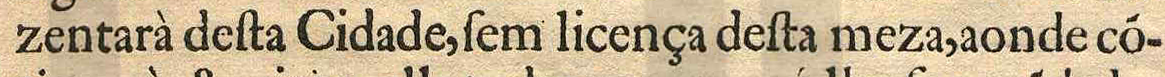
zentarà desta Cidade, sem licença desta meza, aonde cō
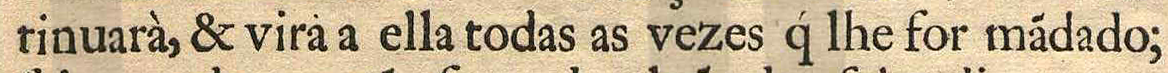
tinuarà, & virá a ella todas as vezes q̄ lhe for mādado;
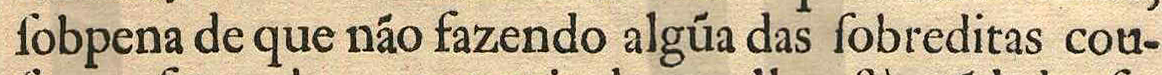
sob pena de que não fazendo algūa das sobreditas cou
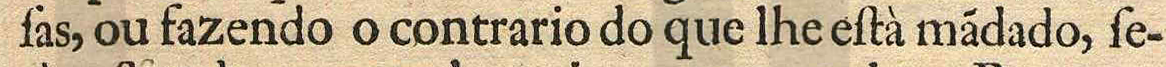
sas, ou fazendo o contrario do que lhe està mādado, se
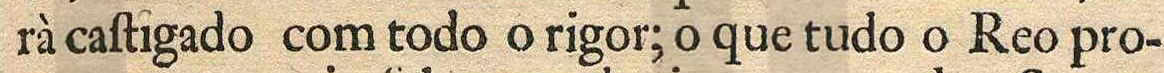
rà castigado com todo o rigor, o que tudo o Reo pro
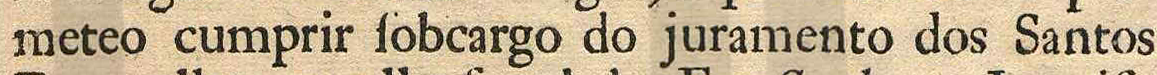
meteo cumprir sob cargo do juramento dos Santos
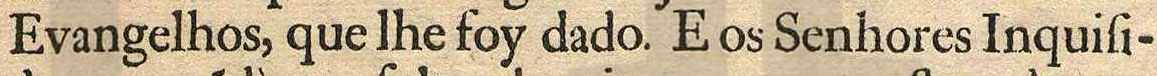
Evangelhos, que lhe foy dado. E os Senhores Inquisi
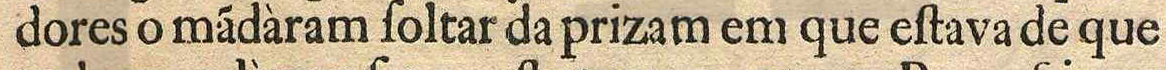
dores o mādaram soltar da prizam em que estava de que
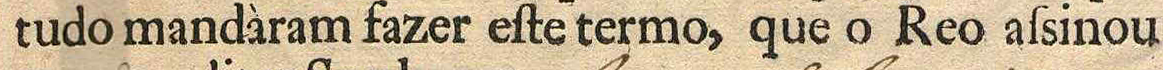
tudo mandàram fazer este termo, que o Reo assinou
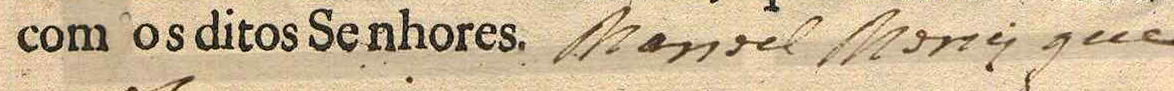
com os ditos Senhores. Manoel Monis que
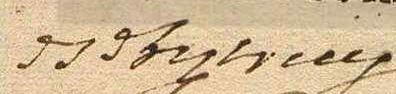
o sobescreuj
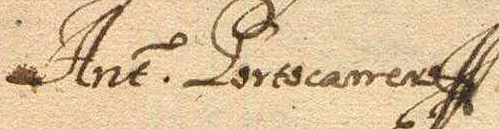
Ant.o Portocarrero
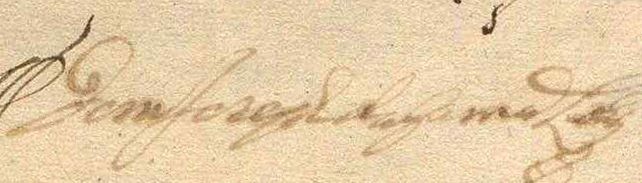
Dom Jozeph da Gama
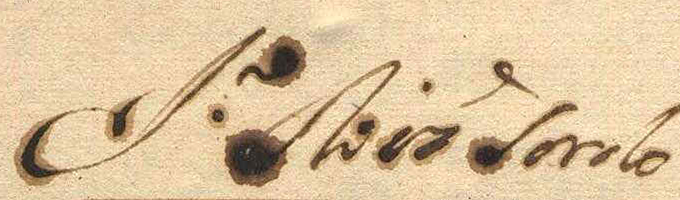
I.o Roiz̄ Sordo
